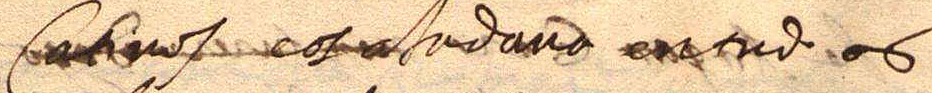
Catiuos e os aIudaua em tudo o q̄
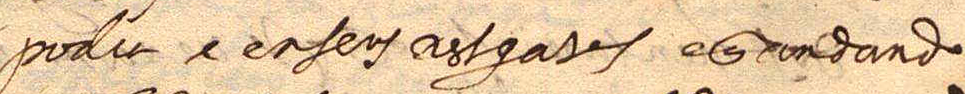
podia e en seus reslgates e q̄ andando
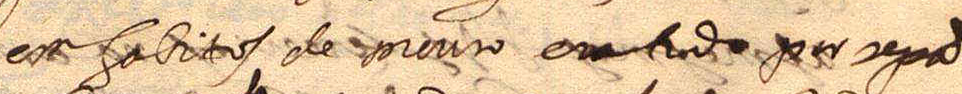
em habitos de mouro era tido por xpaõ
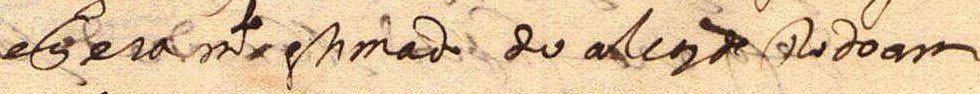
e q̄ era mto estimado do alcajde Rodoam
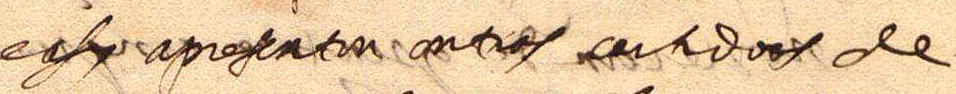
e asy apresentou outras certidoes de
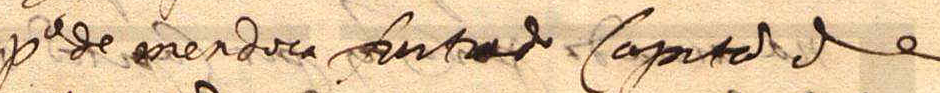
po de mendoca furtado Capitā de
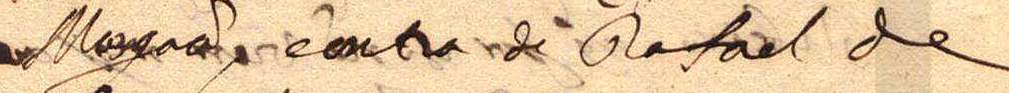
Margaā, e outra de Rafael de
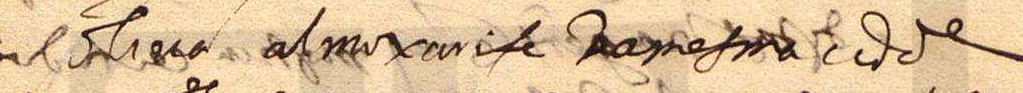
oliua almoxarife da mesma cidade
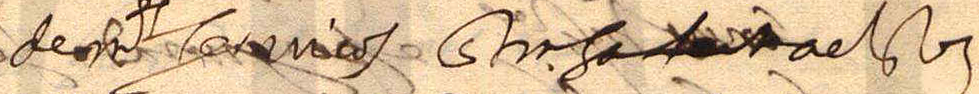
de mtos seruicos q̄ tinha feito a el Rej.
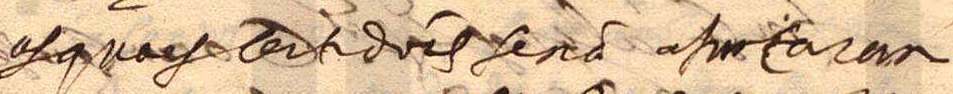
as quaes certidoĩs se nā aJuntaram
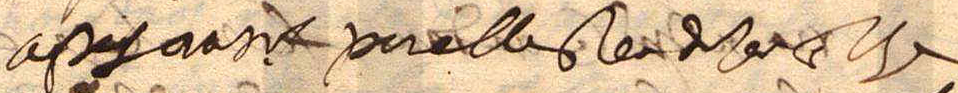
a estes autos por elle Reo dizer q̄ lhe
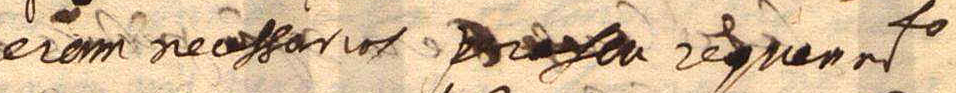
eram necessarias pera seu requerimto
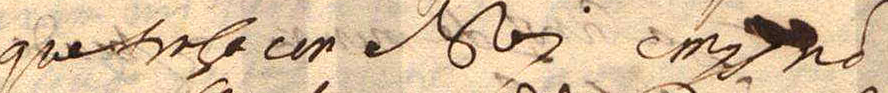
que tinha con el Rej e majs nā
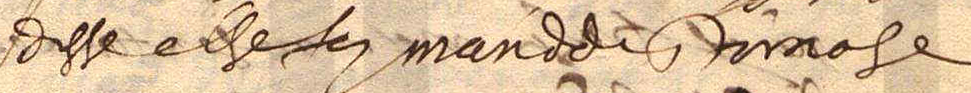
disse e lhe foj mandado q̄ tornase
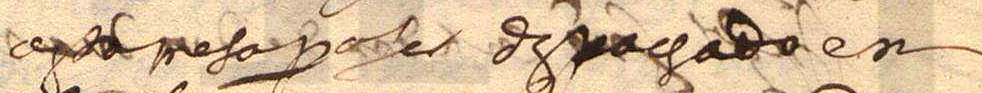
a esta mesa ꝑa ser despachado en
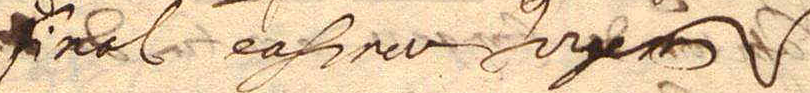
sinal e asinou Jorge m̄
